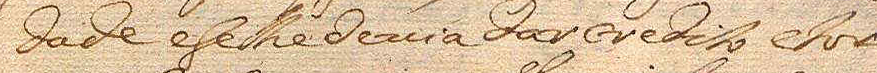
dade e se lhe deuia dar credito e tor
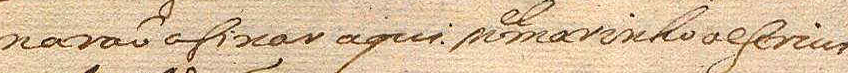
naraõ asinar aqui Mel marinho o escriui
